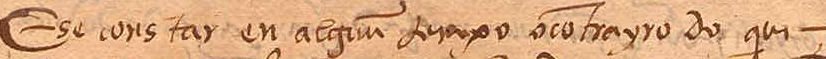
E se constar en alguū tempo o cōtrayro do que
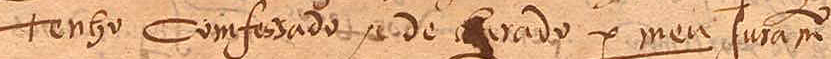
tenho Comfessado e declarado ꝑ meu Juramto
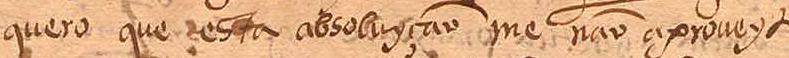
quero que esta absoluyção me não aproueyte
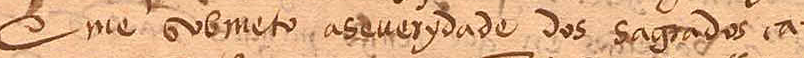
e me sobmeto a seuerydade dos sagrados ca
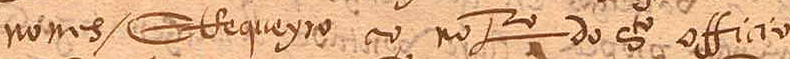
nones / E Requeyro ao notro do Sto officio
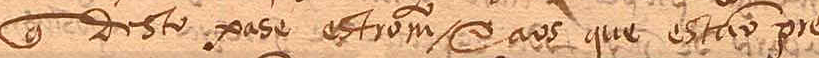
q̄ desto pase estromto / e aos que estão pre
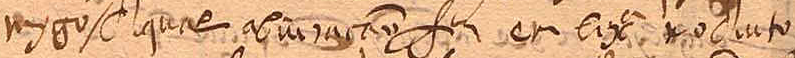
mygo / A qual abiuração fez em lixa no Auto
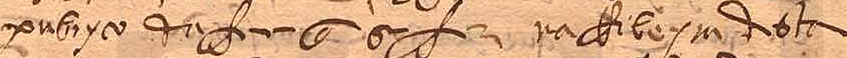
pubryco da fee q̄ se fez a Ribeyra desta
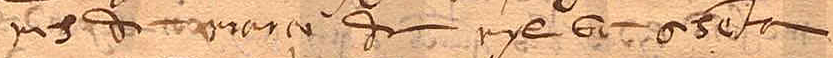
mes de março de myl bc sesēta
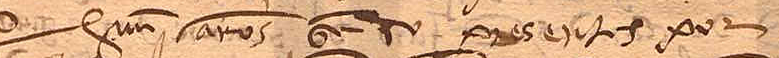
e huū an̄os sēdo presentes por
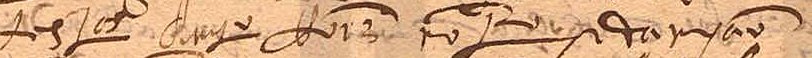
testas Amto Rōiz notro e damyão
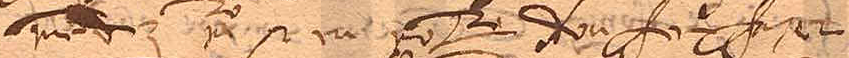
mēdez mro e eu notro dou fee fazer
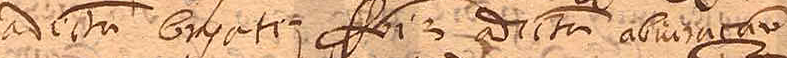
a dict̄a bryatiz Rōiz a dict̄a abiuração
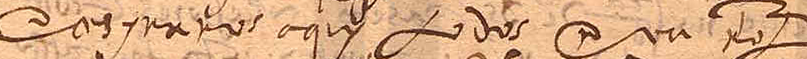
e asynamos aquy todos e eu notro
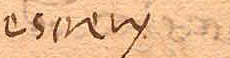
escreuy
